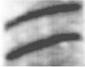二
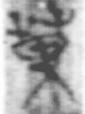菓（戈）
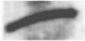一
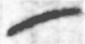一
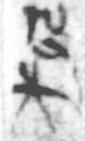杸
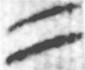二
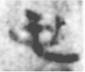屯
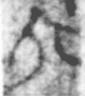六
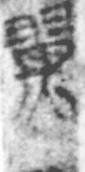翼
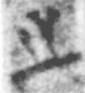之
